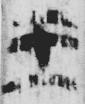王
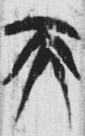天
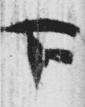下
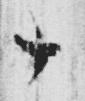十
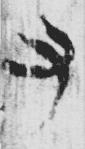又（有）
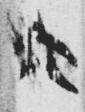六
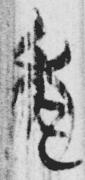年（世）
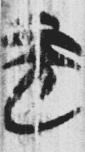而
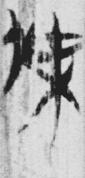傑（桀）
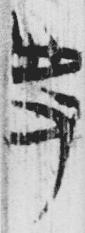拃（作）
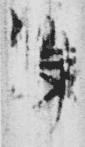傑（桀）
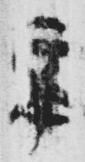不
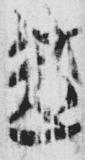述
